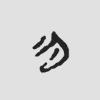勿
